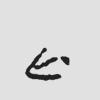㠯（以）
